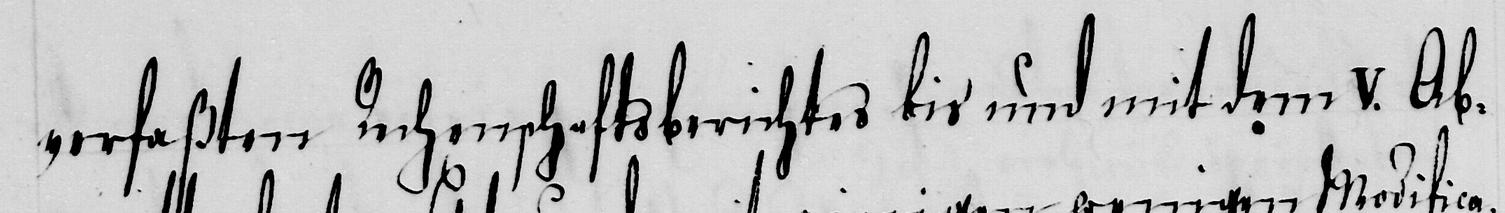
verfaßten Rechenschaftsberichtes bis und mit dem V. Ab¬
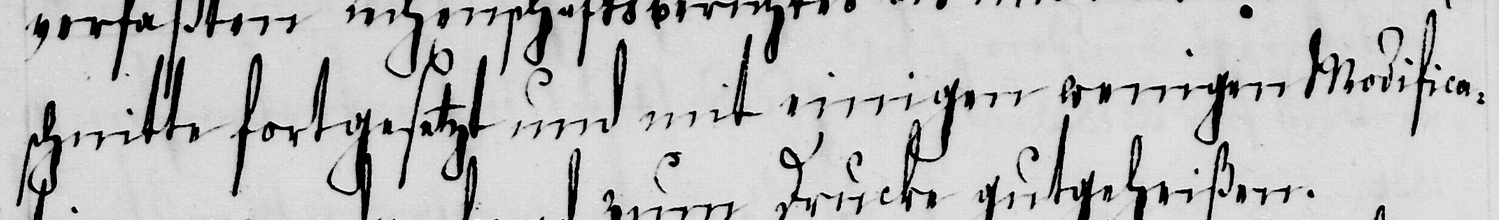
schnitte fortgesetzt und mit einigen wenigen Modifica¬
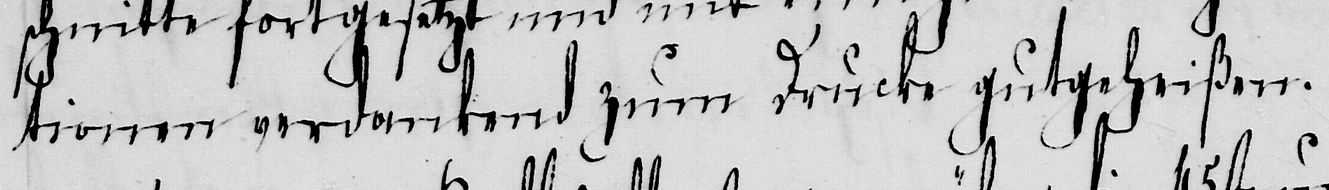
tionen verdankend zum Drucke gutgeheißen.
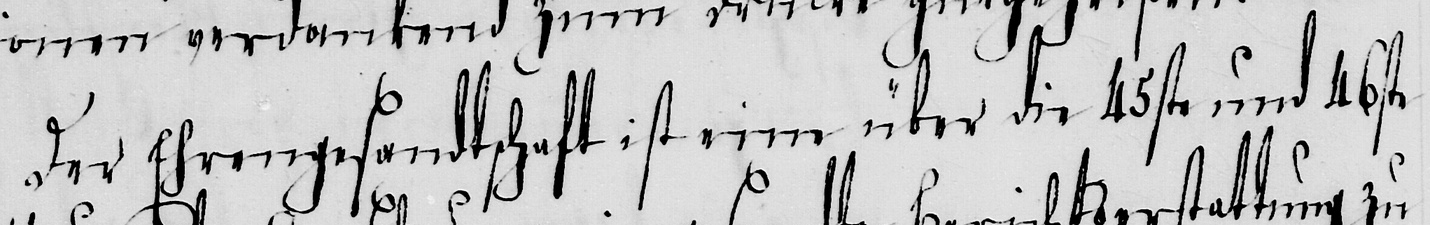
Der Ehrengesandtschaft ist eine über die 45ste und 46ste
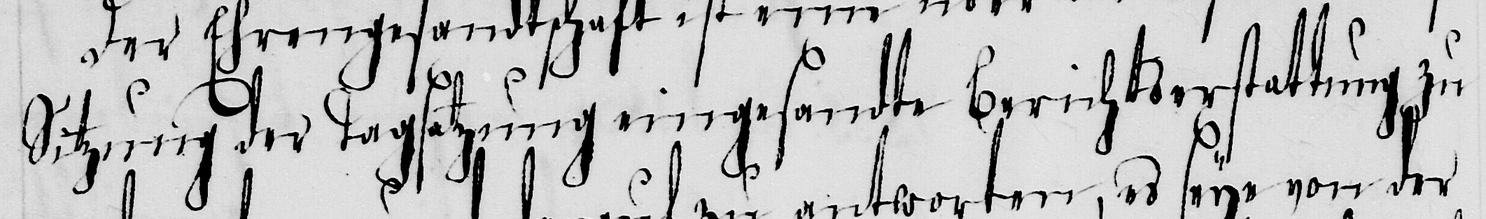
Sitzung der Tagsatzung eingesandte Berichterstattung zu
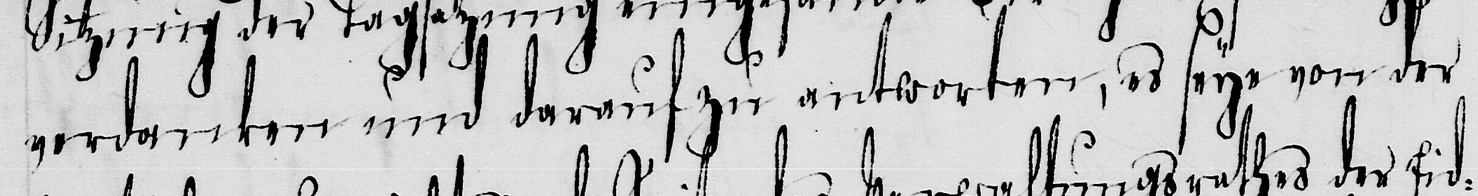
verdanken und darauf zu antworten, es seye von der
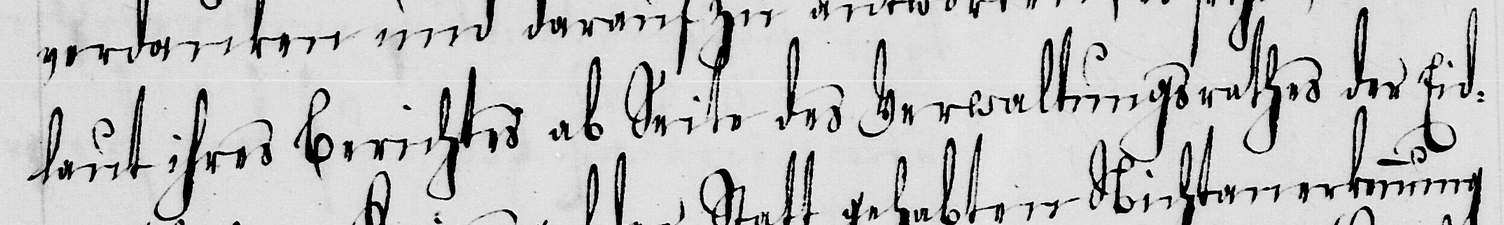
laut ihres Berichtes ab Seite des Verwaltungsrathes der Ei¬
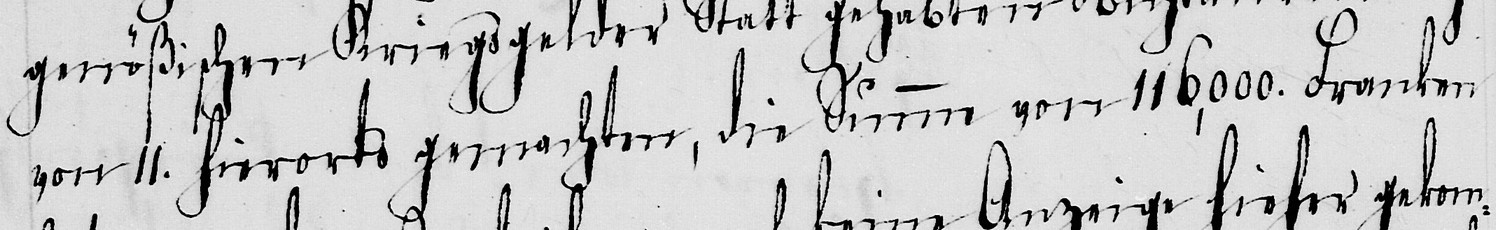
von 11. hierorts gemachten, die Summe von 116,000. Franken
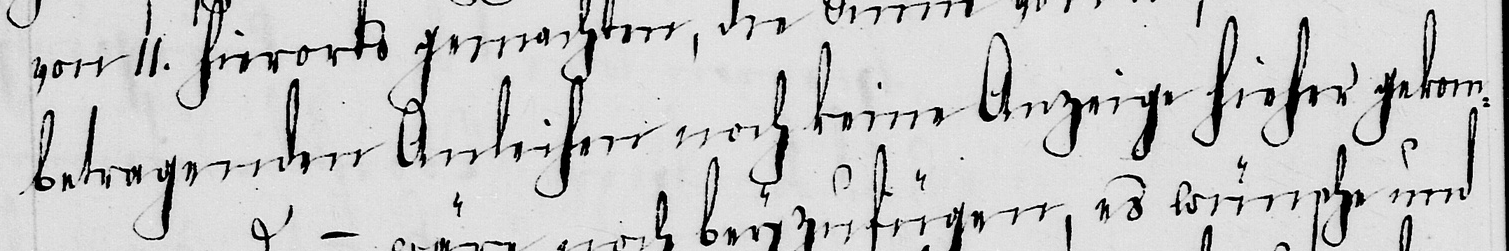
betragenden Anleihen noch keine Anzeige hieher geko¬
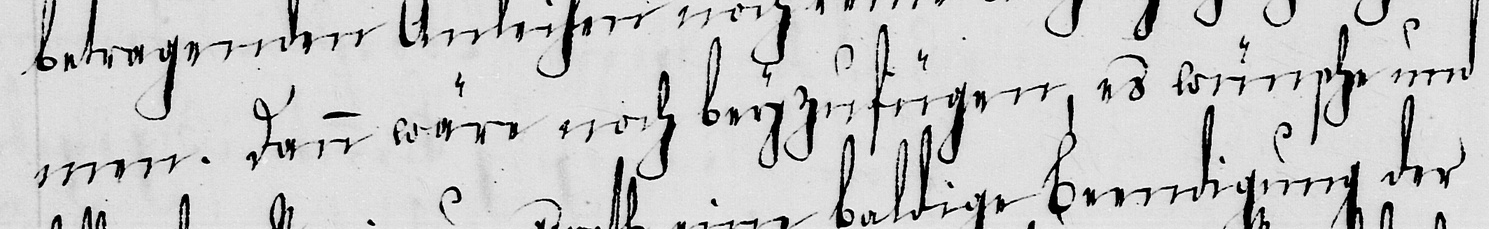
mmen. Dann wäre noch beyzufügen, es wünsche und
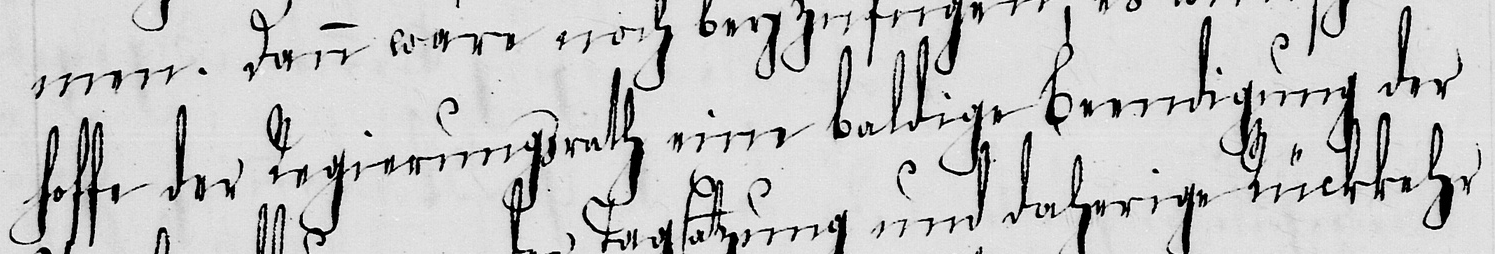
hoffe der Regierungsrath eine baldige Beendigung der
